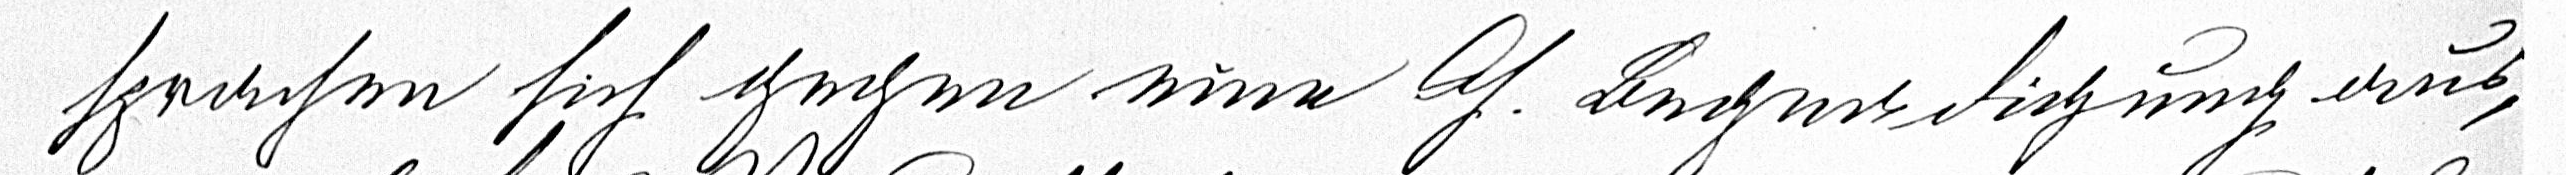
sprache sich gegen eine Ah. Begnadigung aus,
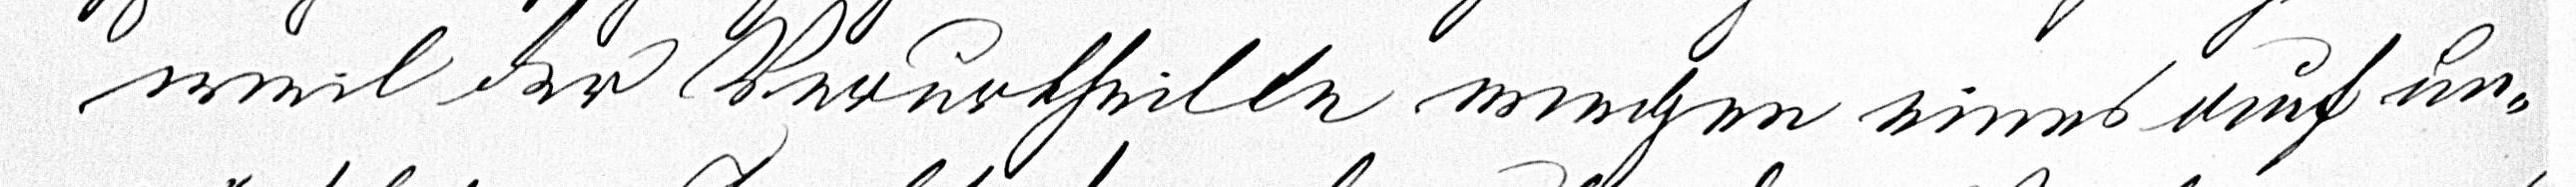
weil der Verurtheilte wegen eines auf un¬
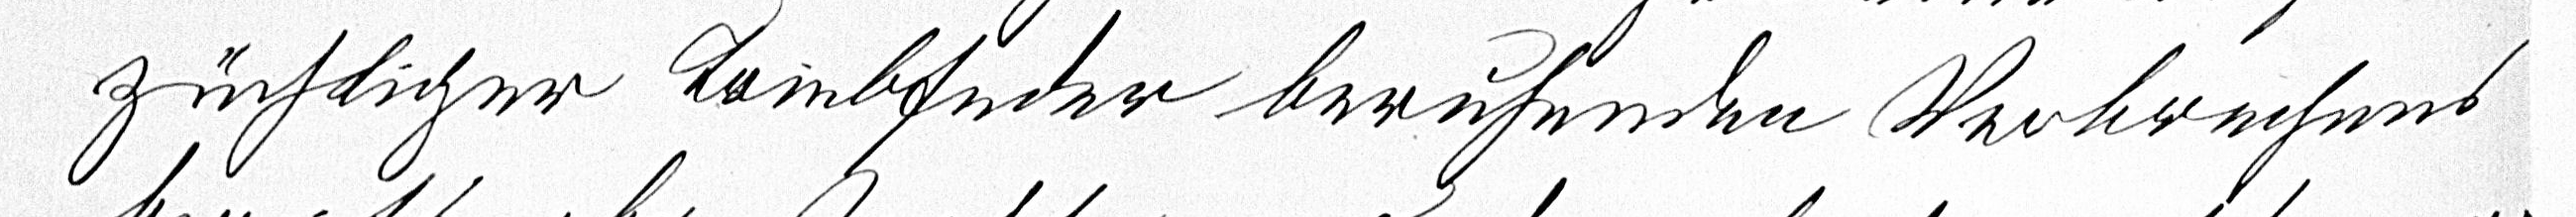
züchdiger Triebfeder beruhenden Verbrechens
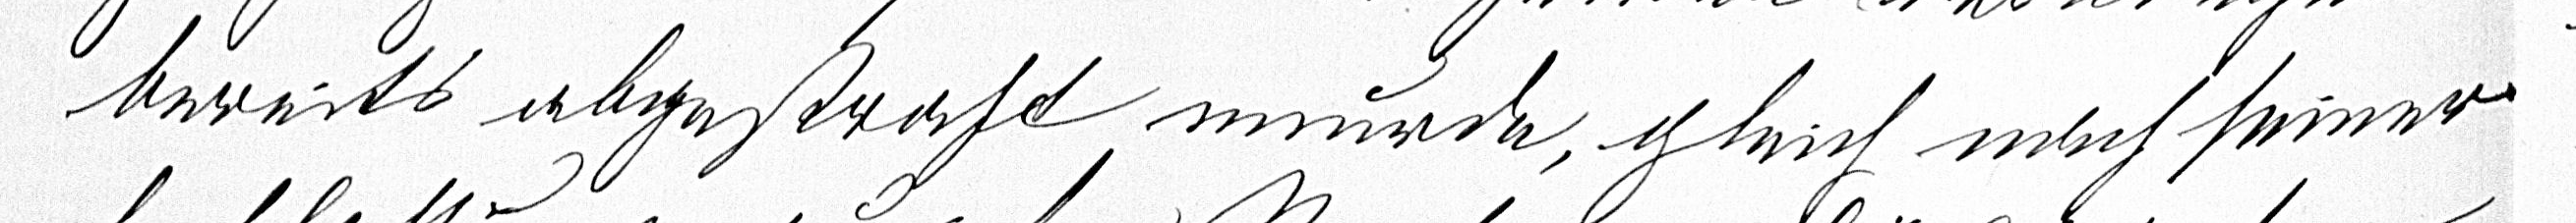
bereits abgestraft wurde, gleich nach seiner
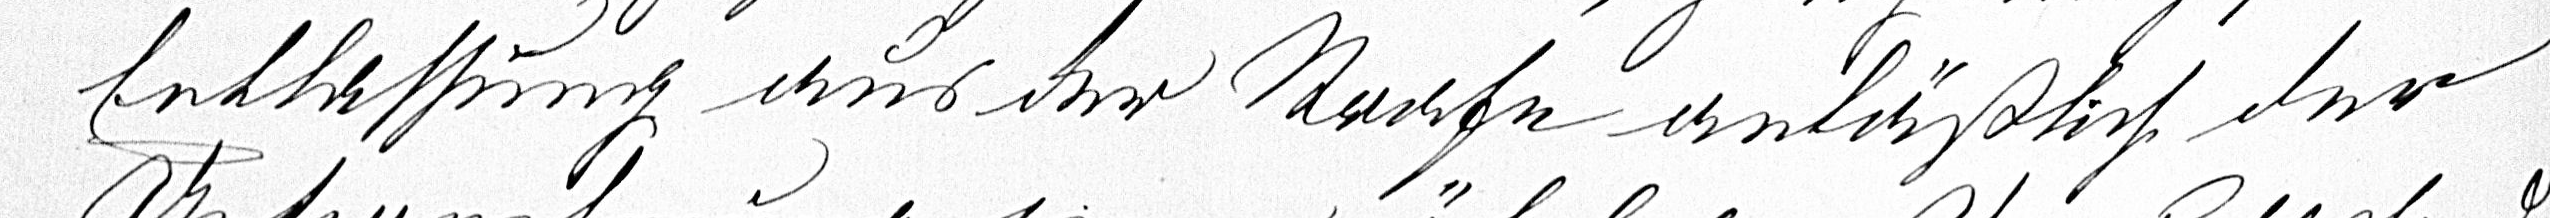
Entlassung aus der Strafe anläßlich der
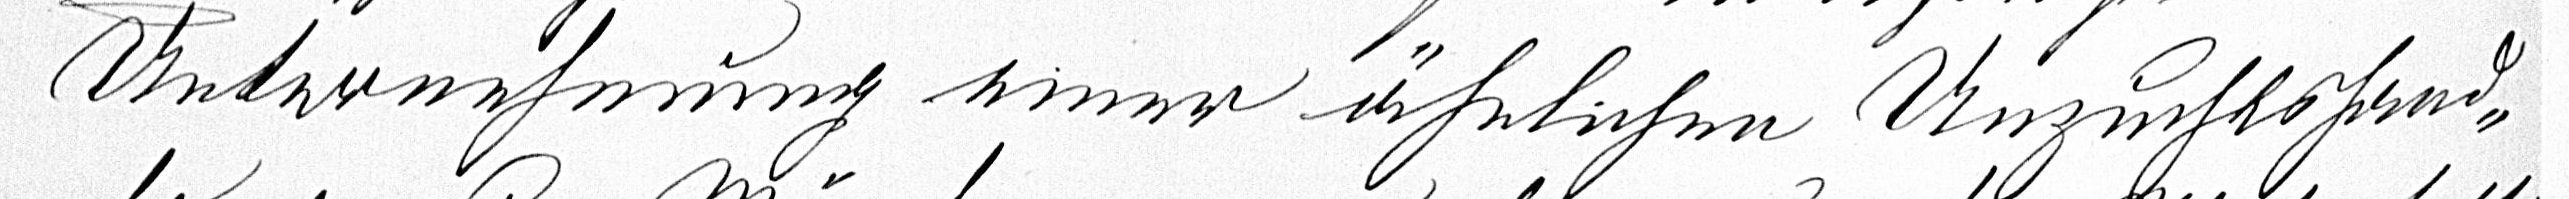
Unternehmung einer ähnlichen Unzuchtshand¬
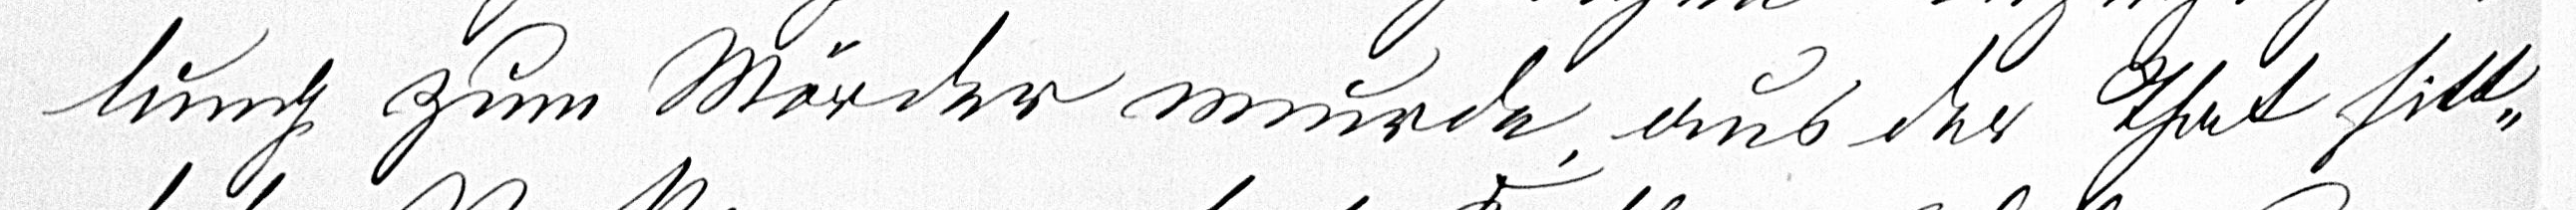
lung zum Mörder wurde, aus der That sitt¬
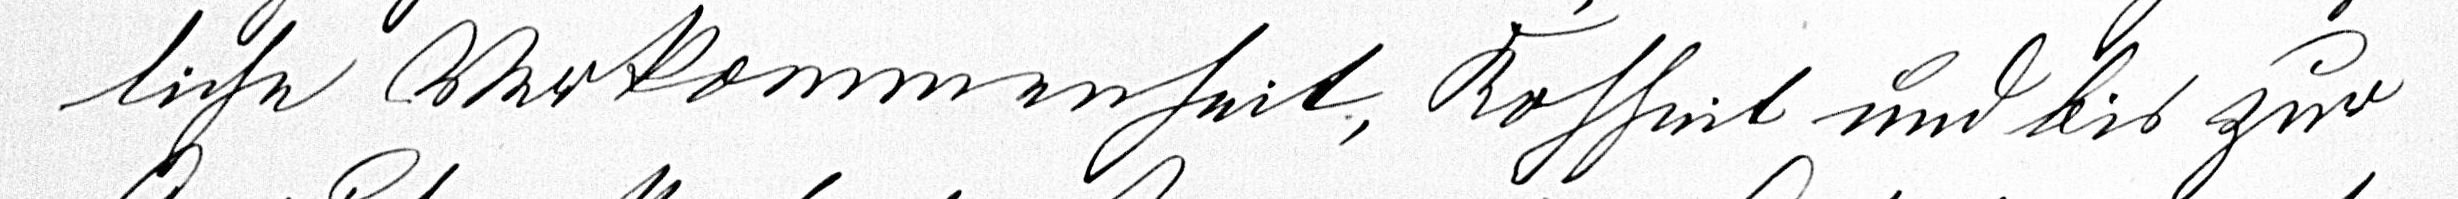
liche Verkommenheit, Rohheit und bis zur
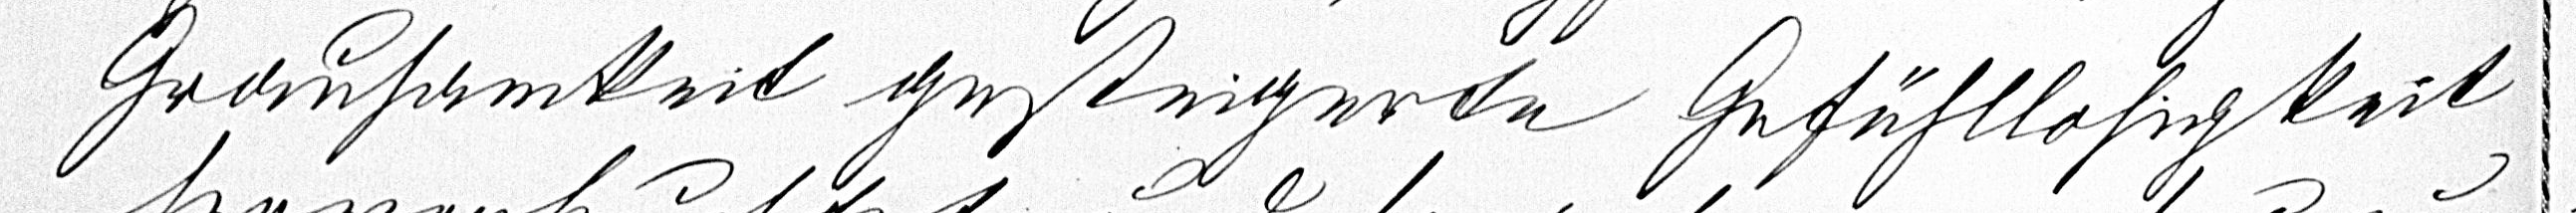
Grausamkeit gesteigerte Gefühllosigkeit
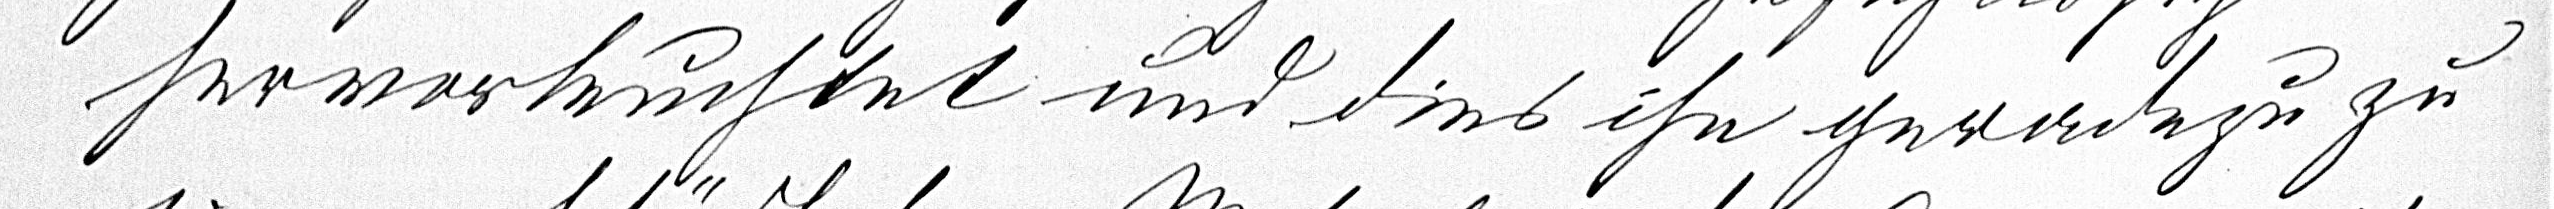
hervorsuchtet und dies ihn geradezu zu
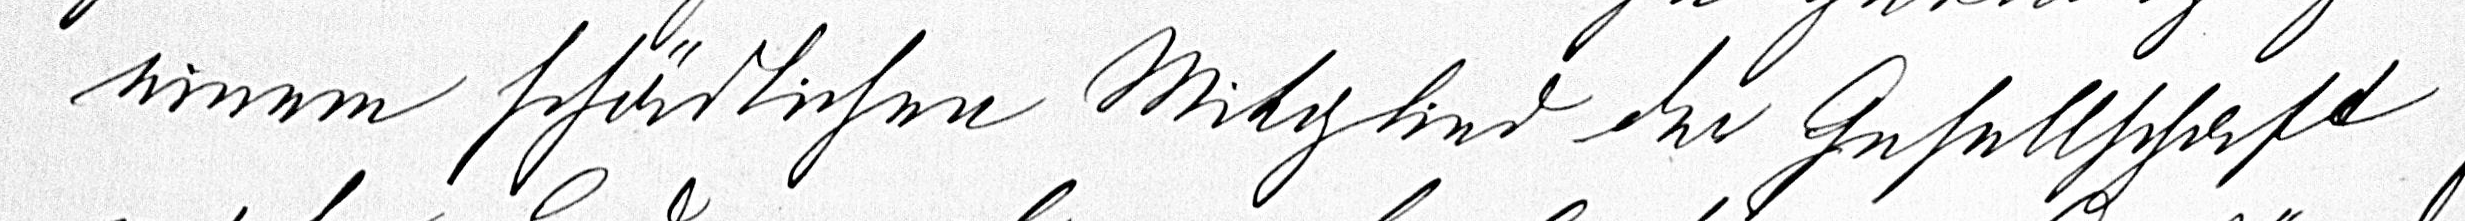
einem schädlichen Mitglied der Gesellschaft
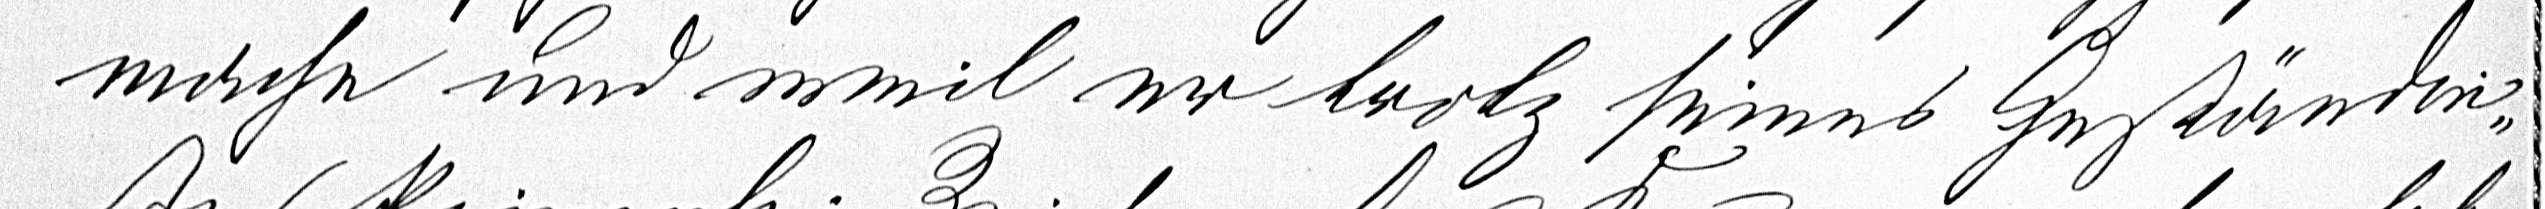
mache und weil er trotz seines Geständni¬
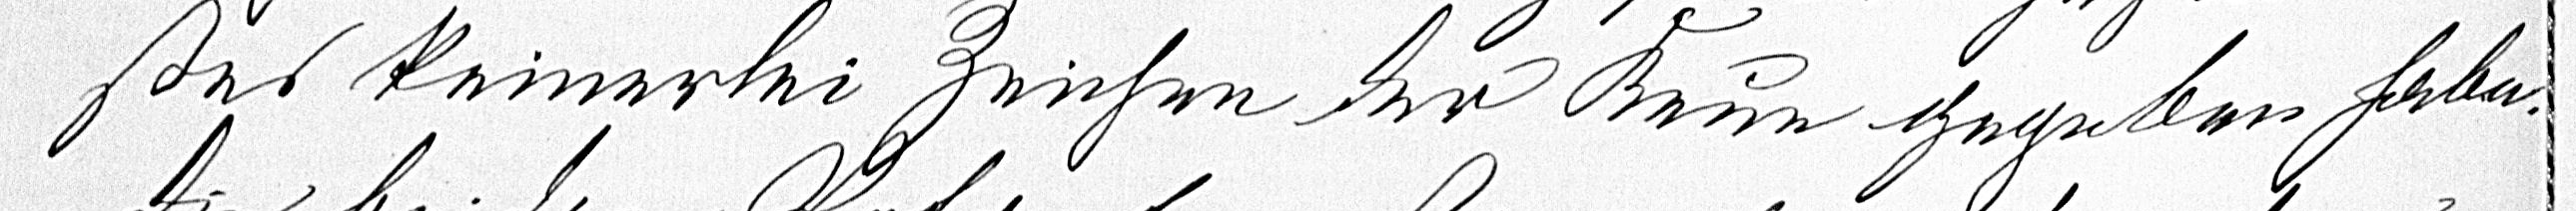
ßes keinerlei Zeichen der Reue gegeben habe.
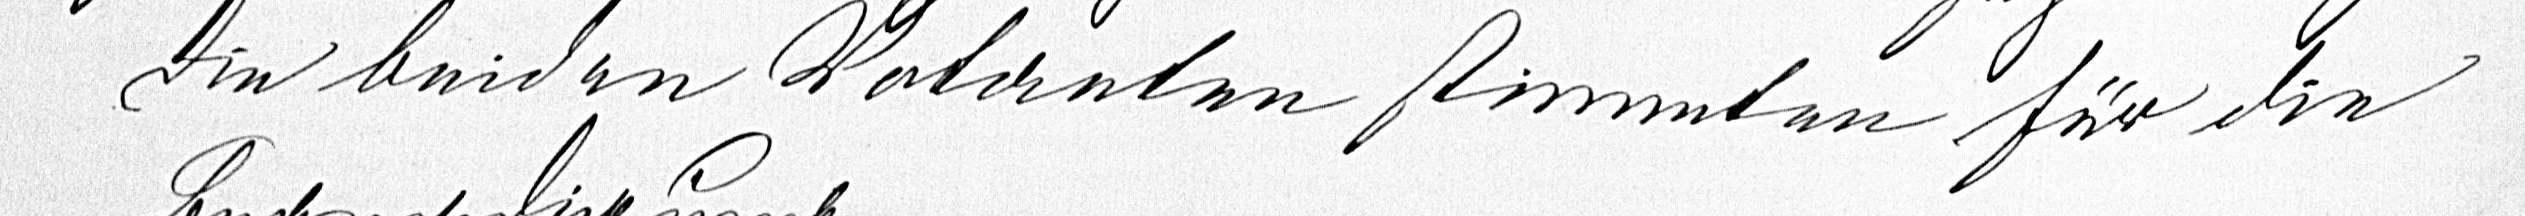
Die beiden Volanten stimmten für die
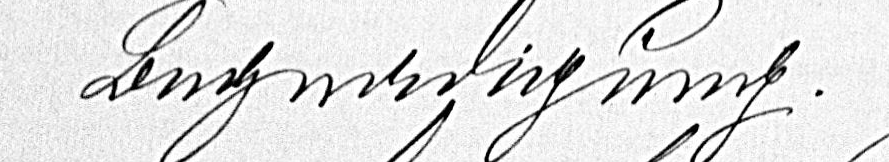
Begnadigung.
